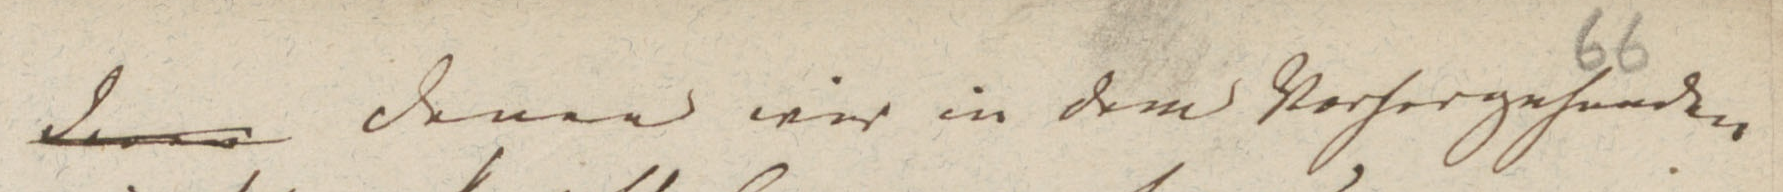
derer denen wir in dem Vorhergehenden
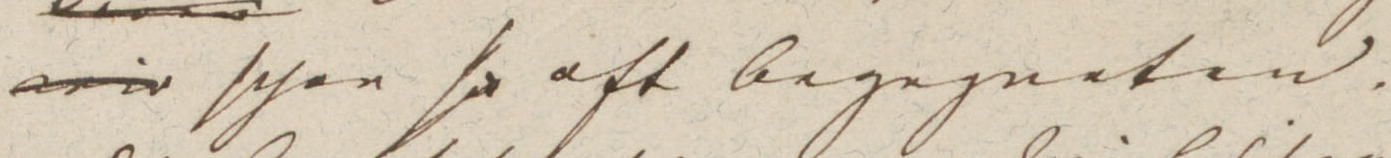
wir schon so oft begegneten.
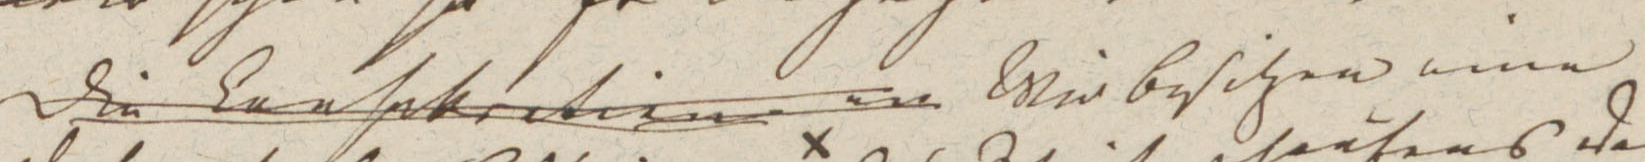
Die Consekration Wir besitzen eine
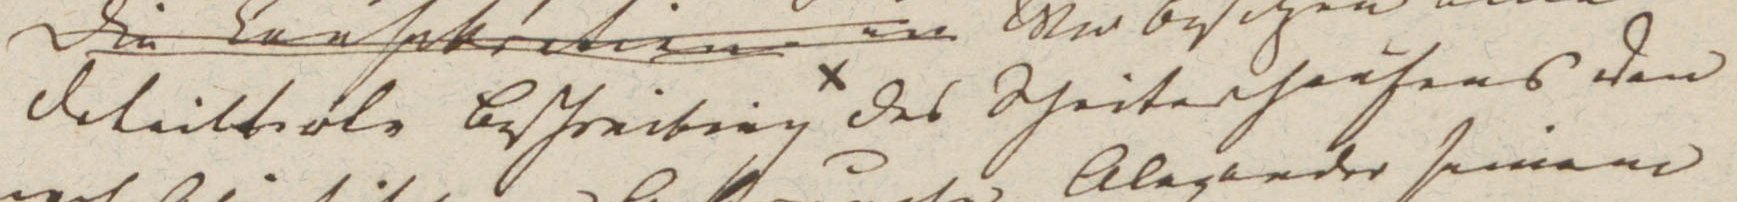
detailirte Beschreibung % des Scheiterhaufens den
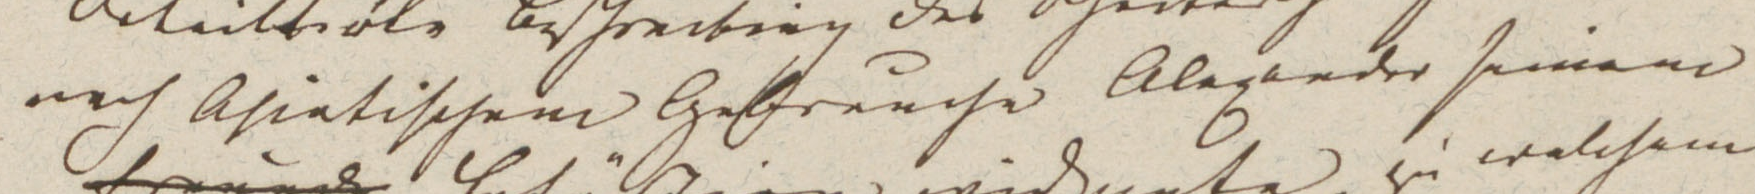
nach Asiatischem Gebrauche Alexander seinem
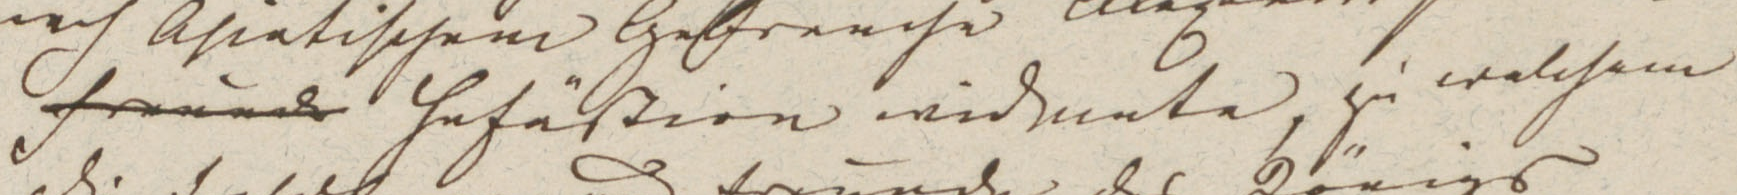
Freunde Hefästion widmete, zu welchem
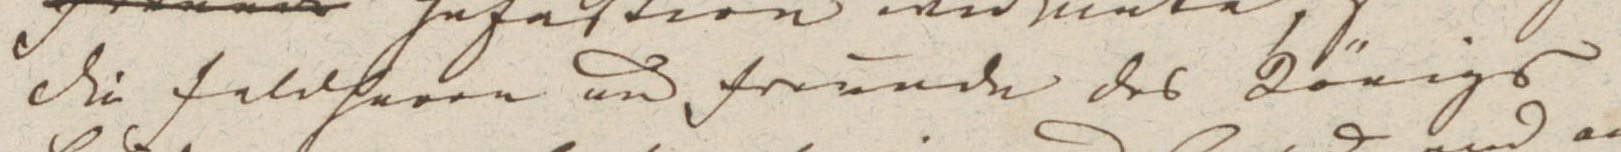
die Feldherrn und Freunde des Königs
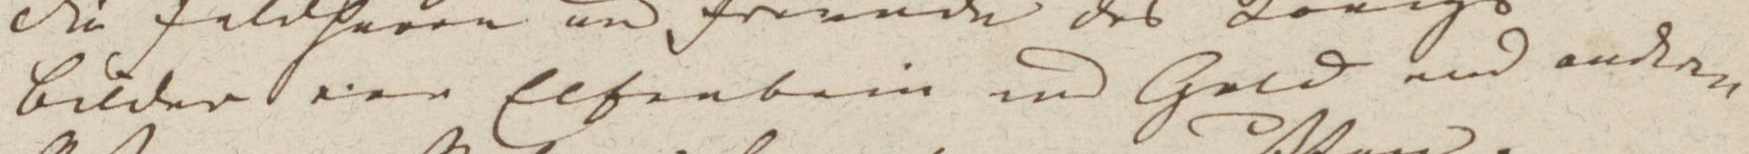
Bilder von Elfenbein und Gold und and
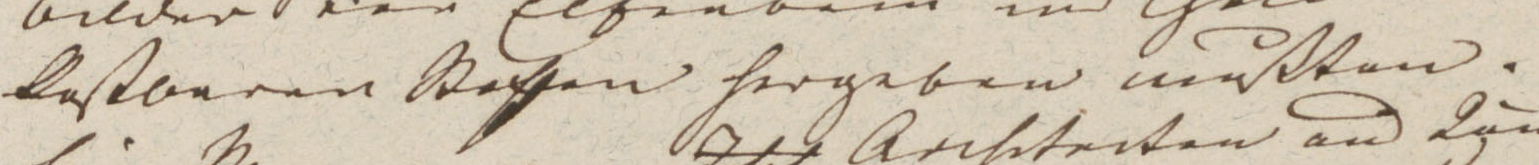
kostbaren Stoffen hergeben mussten.
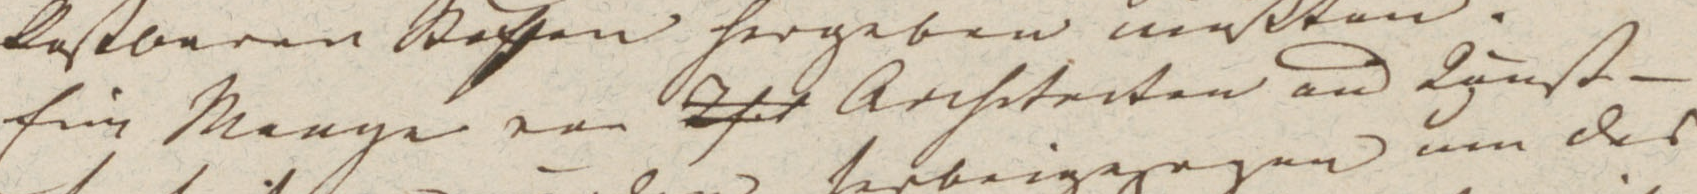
Eine Menge von That Architecten und Kunst-
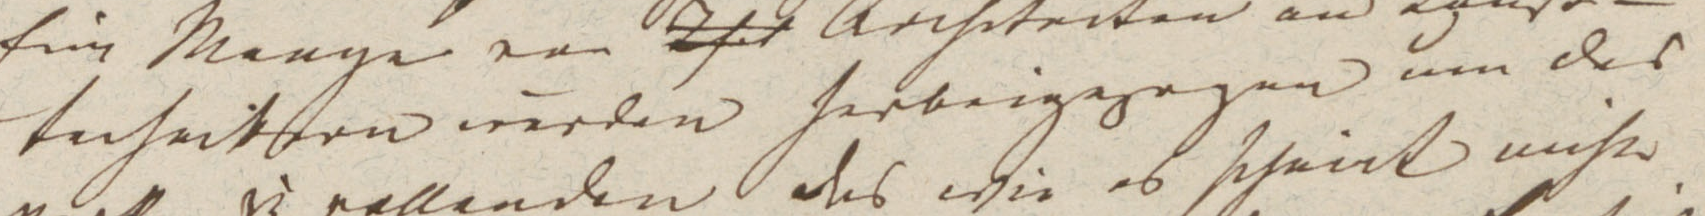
technikern wurden herbeigezogen um das
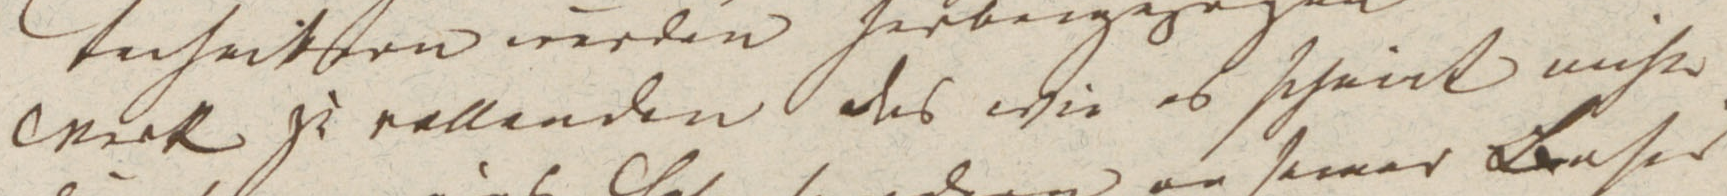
Werk zu vollenden das wie es scheint nicht
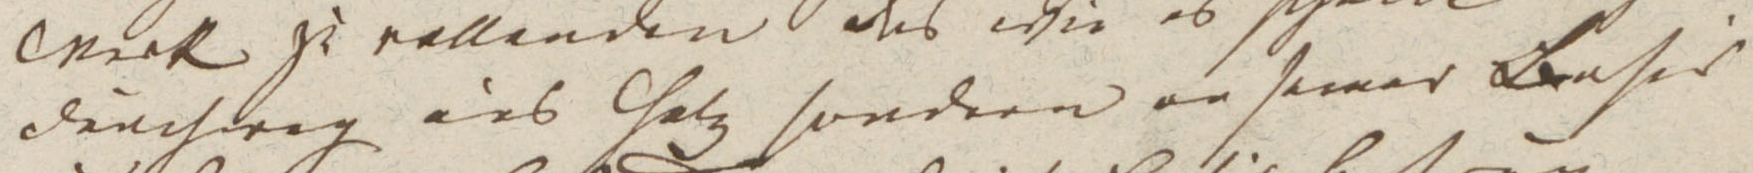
durchweg aus Holz sondern an seiner Basis
